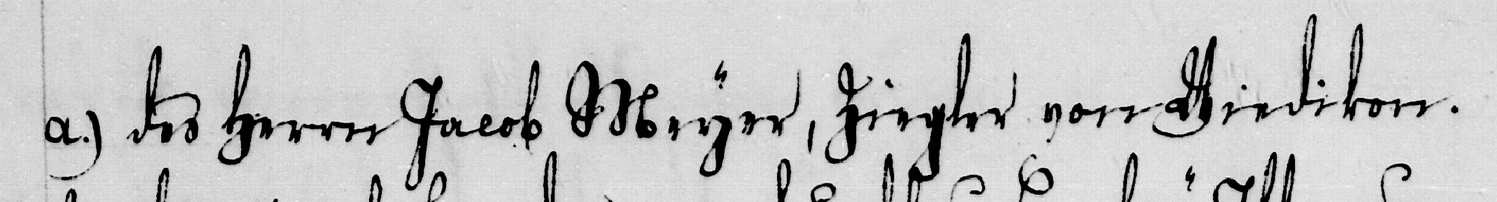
a.) des Herrn Jacob Meyer, Ziegler von Wiedikon.
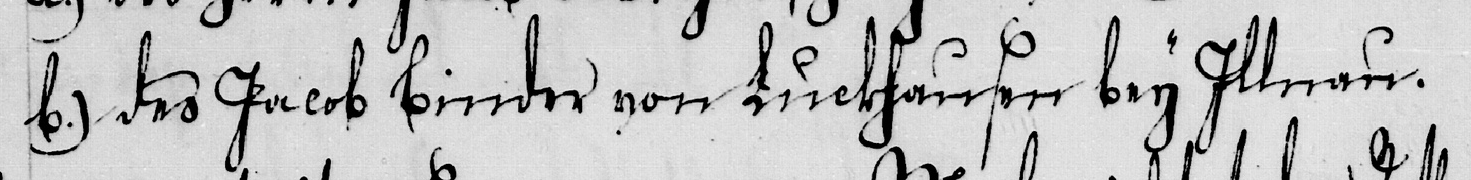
b.) des Jacob Binder von Luckhausen bey Illnau.
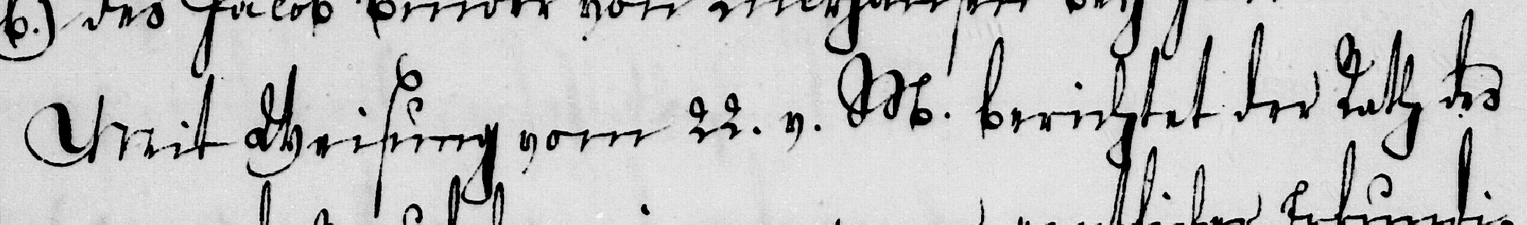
Mit Weisung vom 22. v. M. berichtet der Rath des
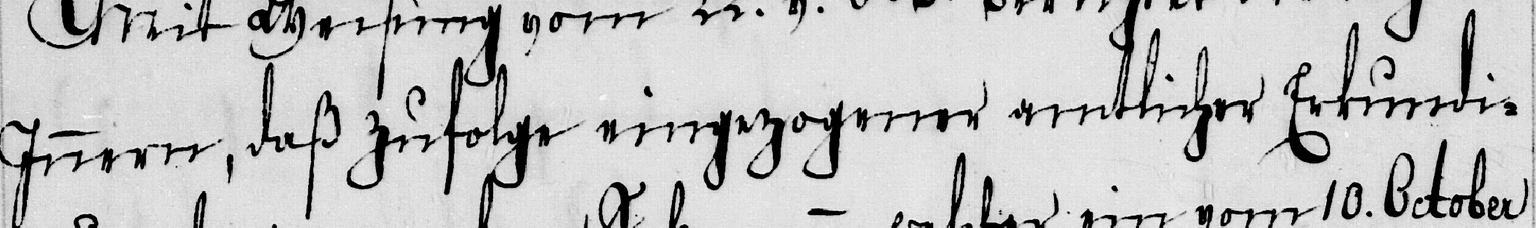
Innern, daß zufolge eingezogener amtlicher Erkundi¬
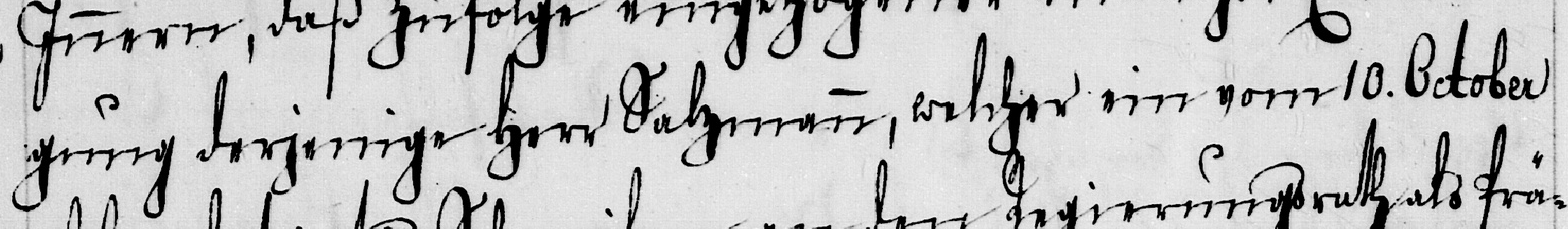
gung derjenige Herr Salzmann, welcher ein vom 10. October
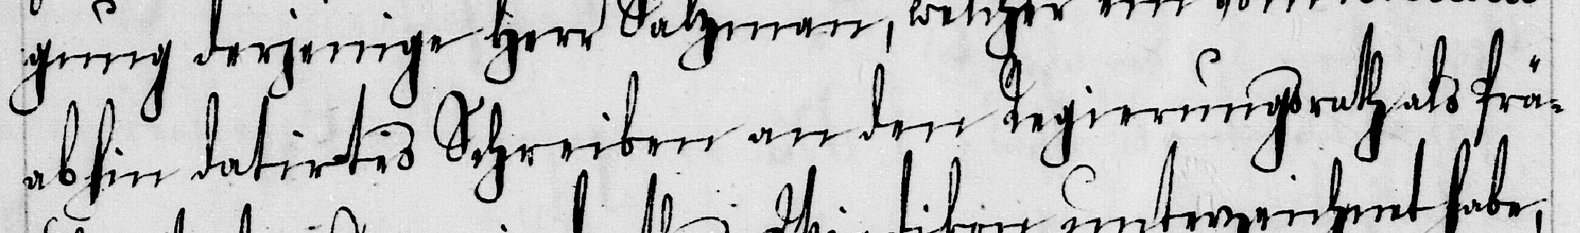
abhin datirtes Schreiben an den Regierungsrath als Prä¬
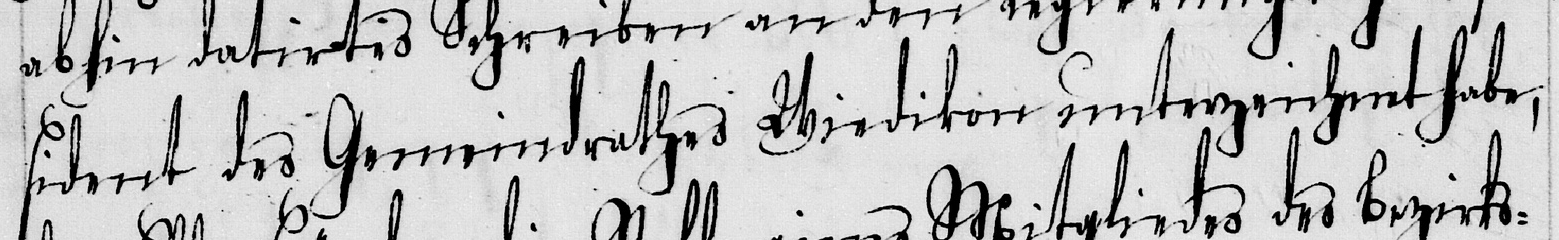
sident des Gemeindrathes Wiedikon unterzeichnet habe,
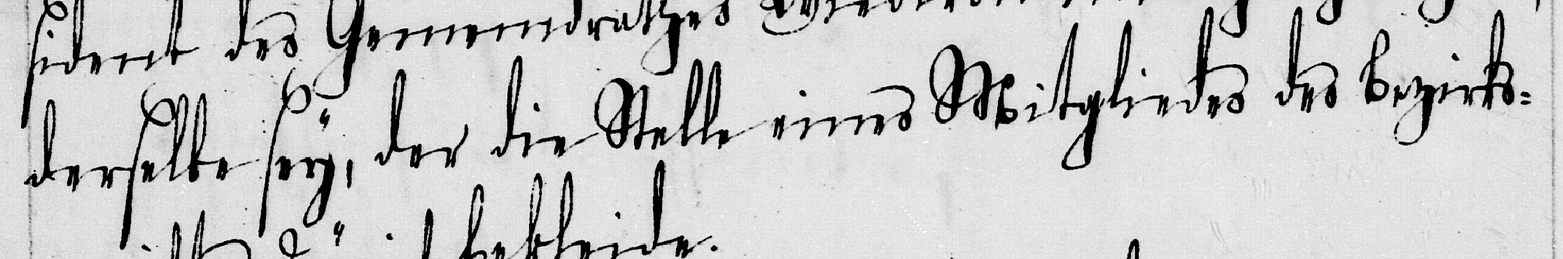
derselbe sey, der die Stelle eines Mitgliedes des Bezirks¬
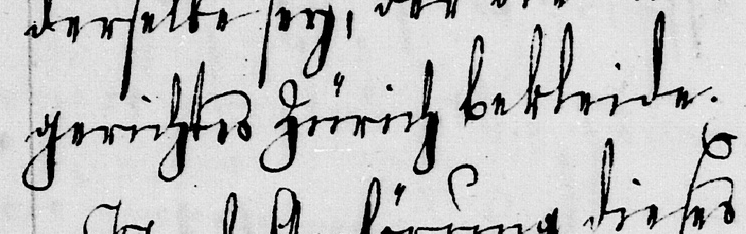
gerichtes Zürich bekleide.
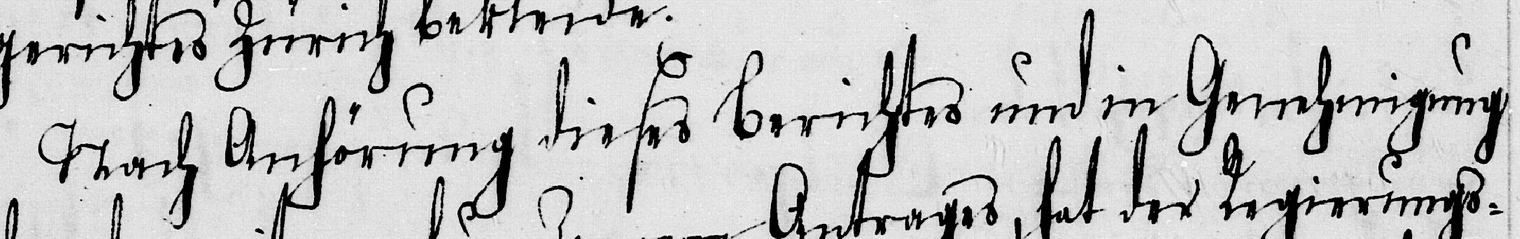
Nach Anhörung dieses Berichtes und in Genehmigung
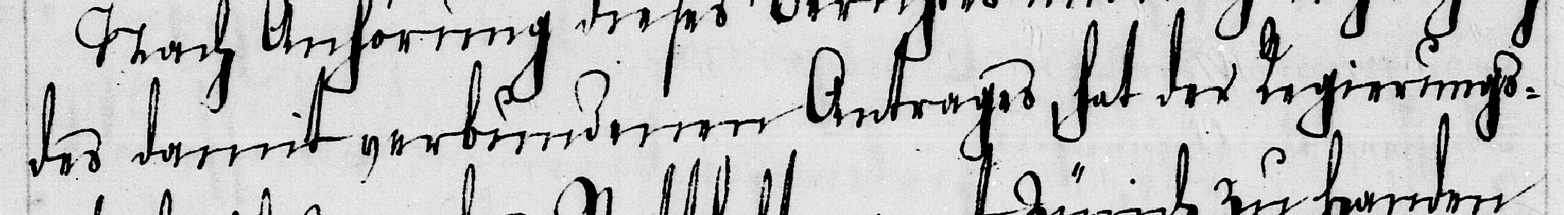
des damit verbundenen Antrages, hat der Regierungs¬
